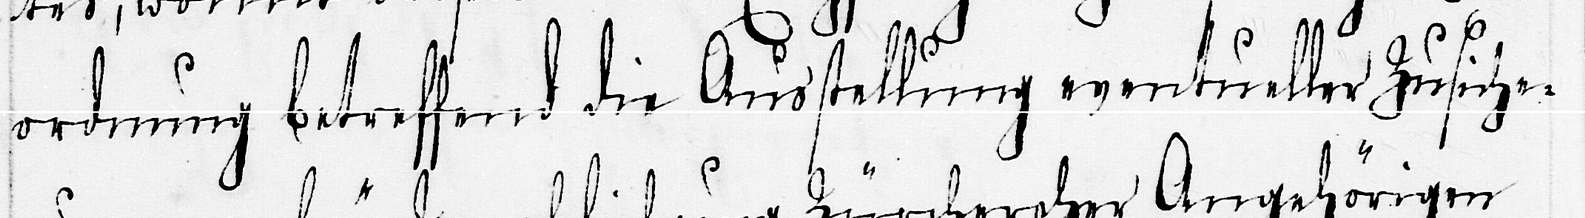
ordnung betreffend die Ausstellung eventueller Zusiche¬
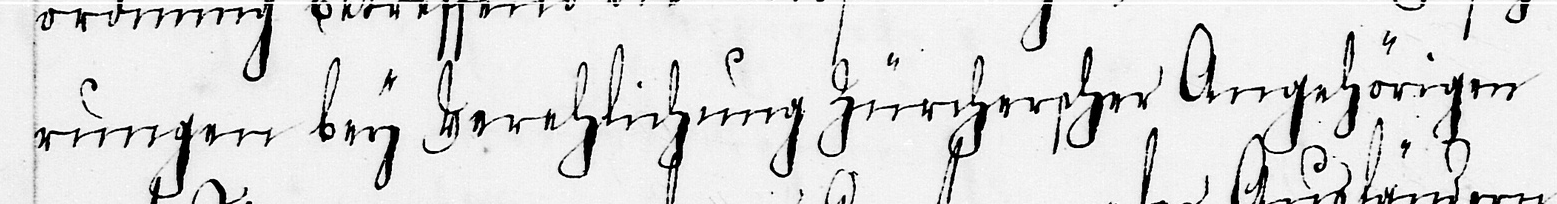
rungen bey Verehlichung Zürcherscher Angehörigen
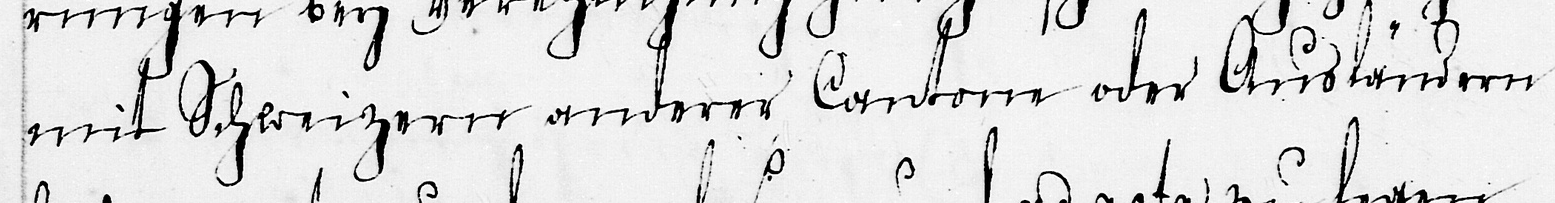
mit Schweizern anderer Cantone oder Ausländern
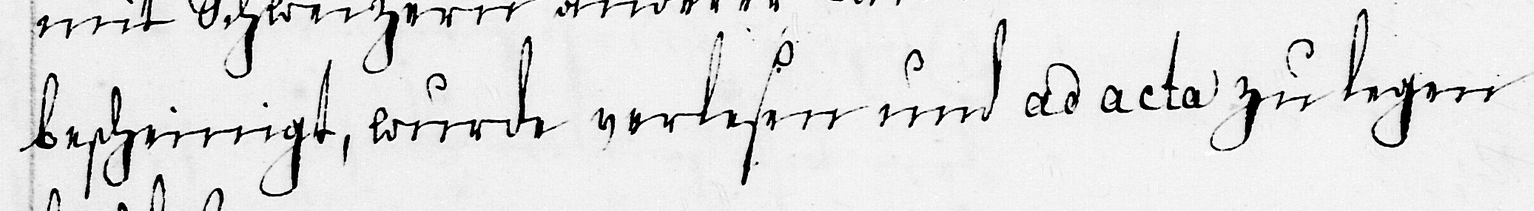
bescheinigt, wurde verlesen und ad acta zu legen
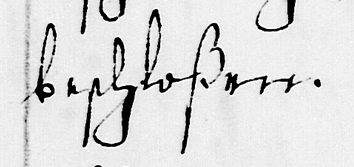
beschloßen.
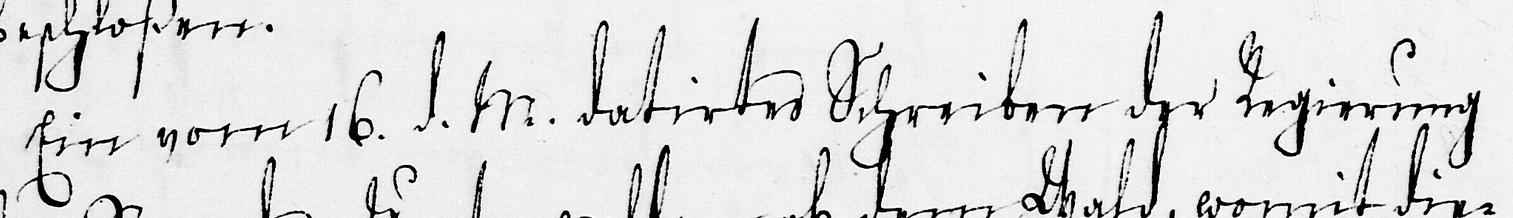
Ein vom 16. d. M. datirtes Schreiben der Regierung
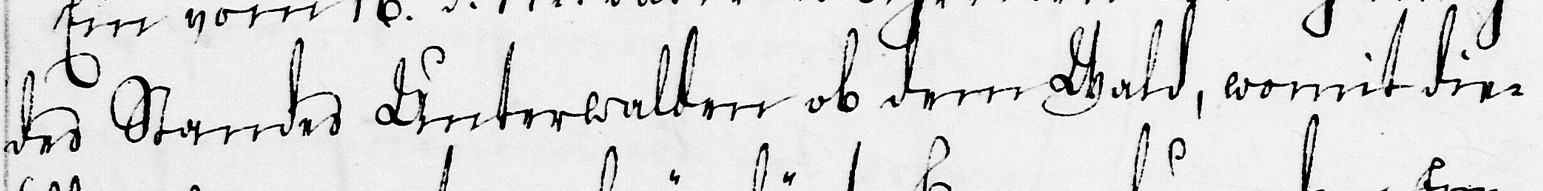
des Standes Unterwalden ob dem Wald, womit dies¬
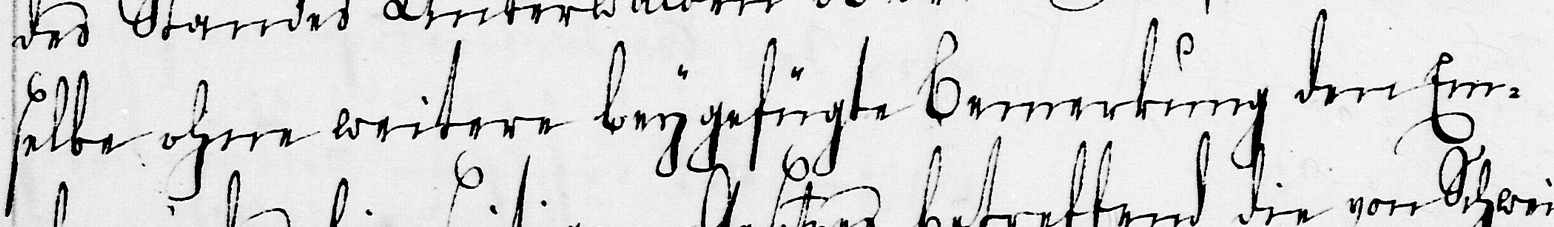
elbe ohne weitere beygefügte Bemerkung den Em¬
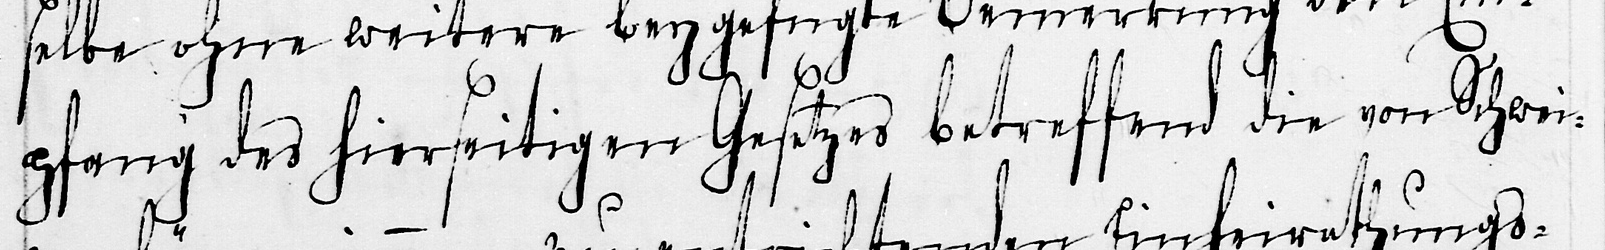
pfang des hierseitigen Gesetzes betreffend die von Schwei¬
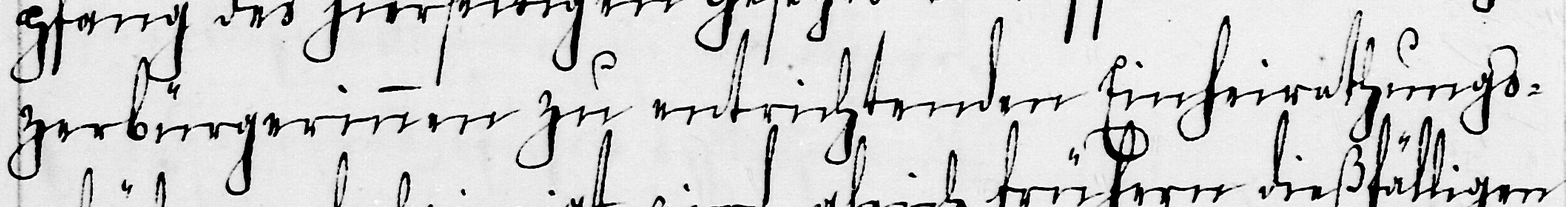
zerbürgerinnen zu entrichtenden Einheirathungs¬
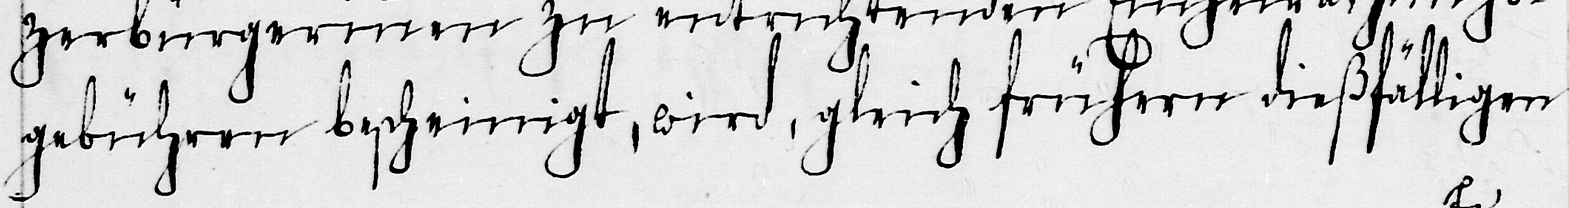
gebühren bescheinigt, wird, gleich frühern dießfälligen
